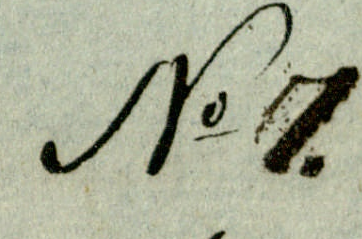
Nº 7.
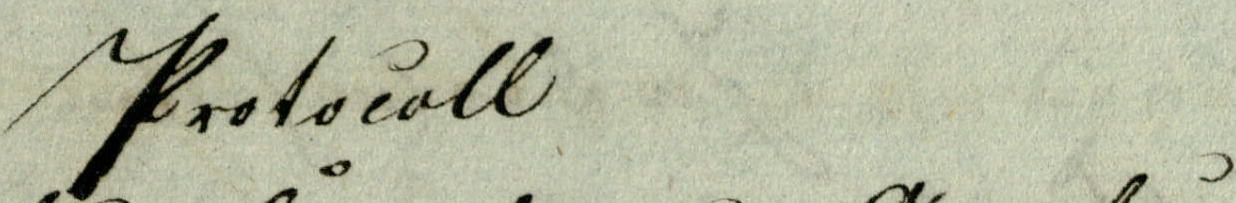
Protocoll
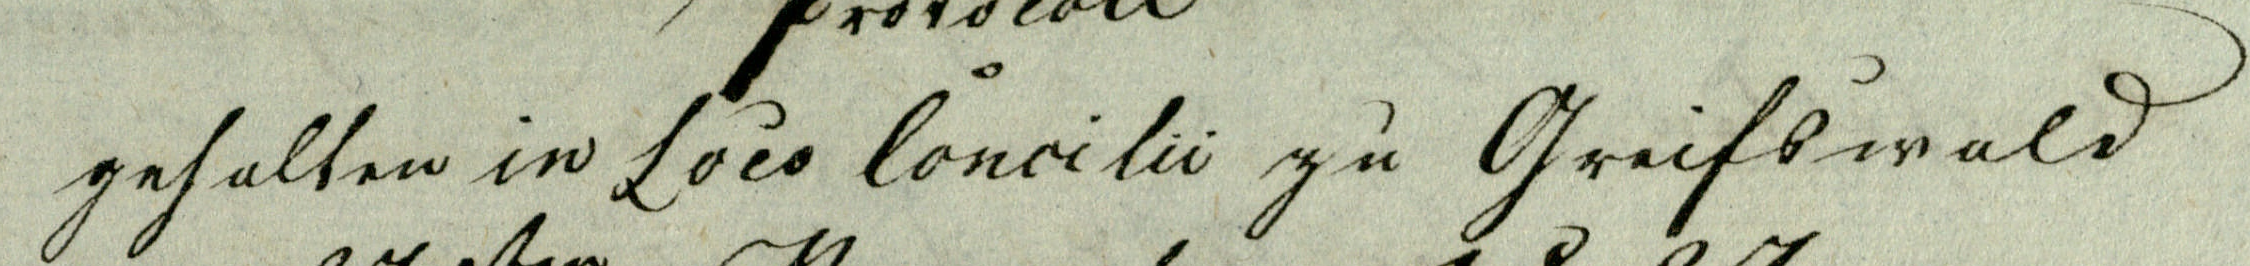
gehalten in Loco Concilii zu Greifswald
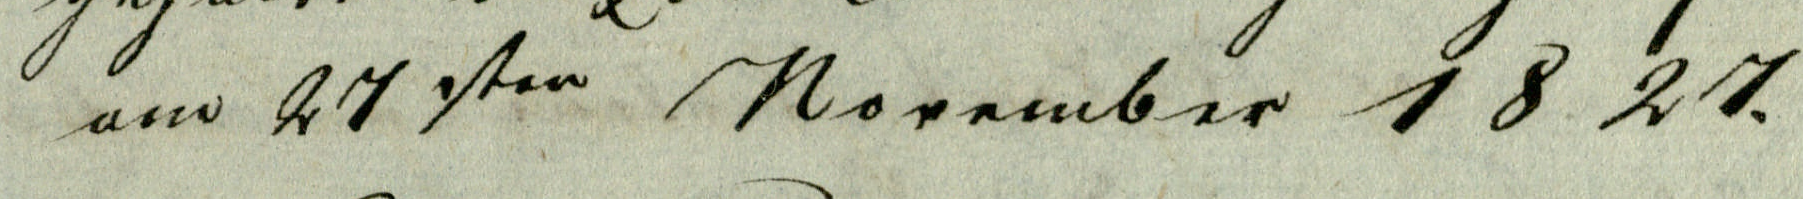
am 27ten November 1827.
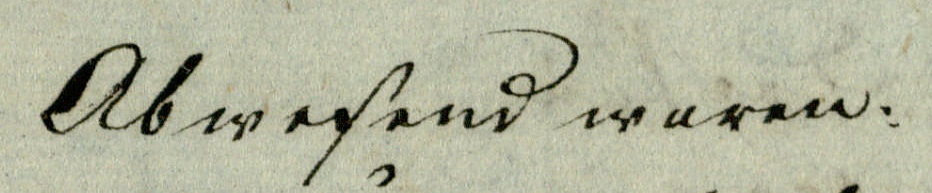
Abwesend waren:
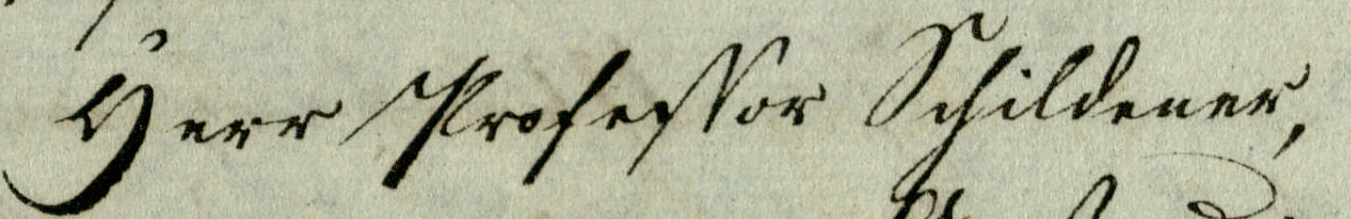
Herr Professor Schildener,
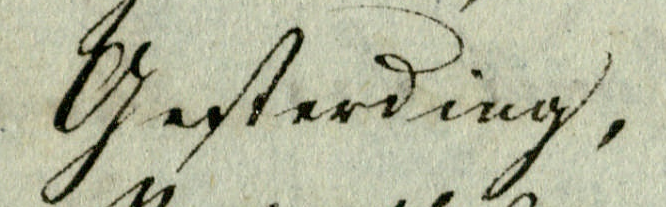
Gesterding,
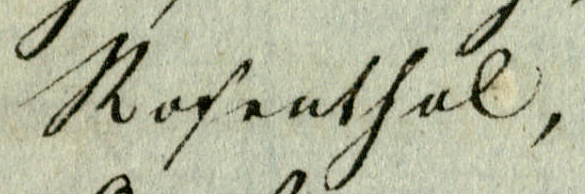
Rosenthal,
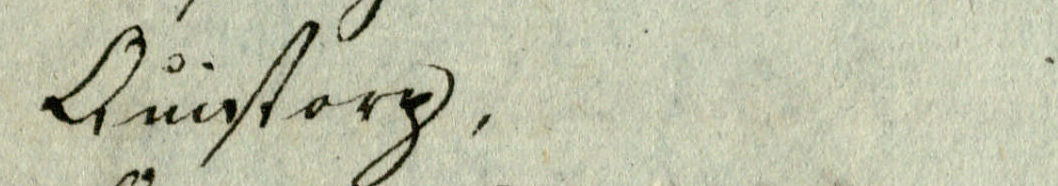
Quistorp,
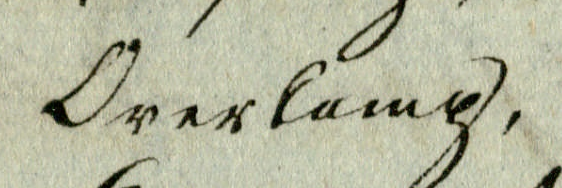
Overkamp,
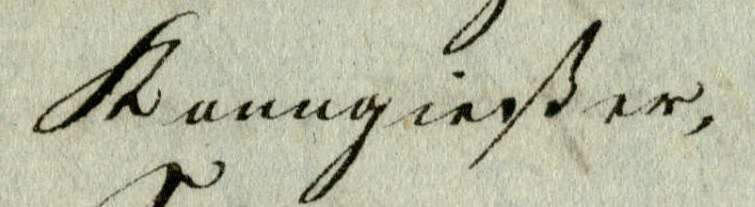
Kanngießer,
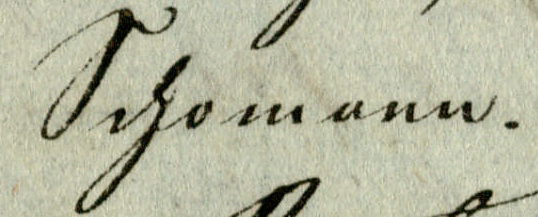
Schomann.
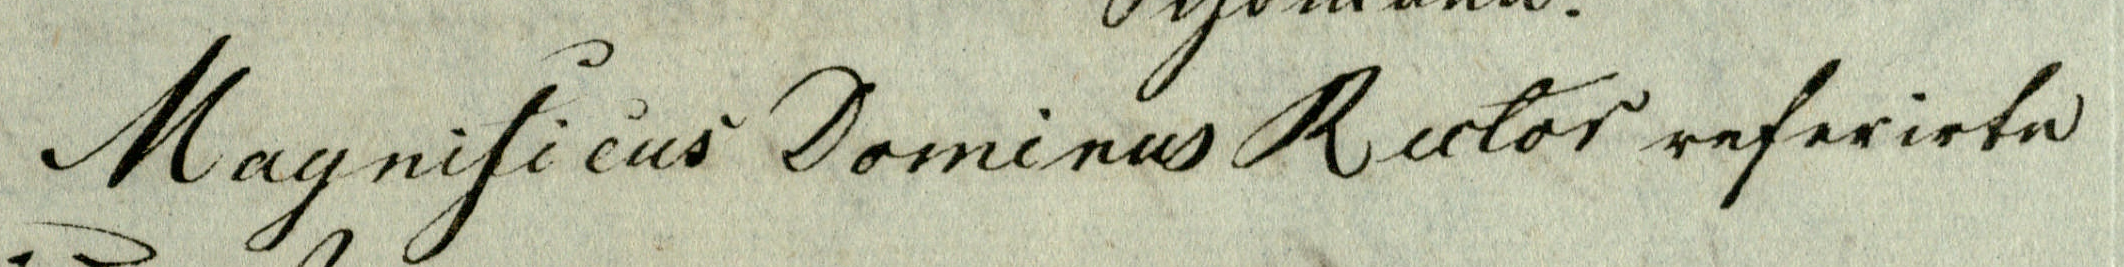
Magnificus Dominus Rector referirte
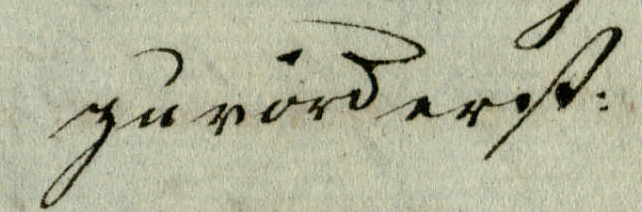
zuvörderst:
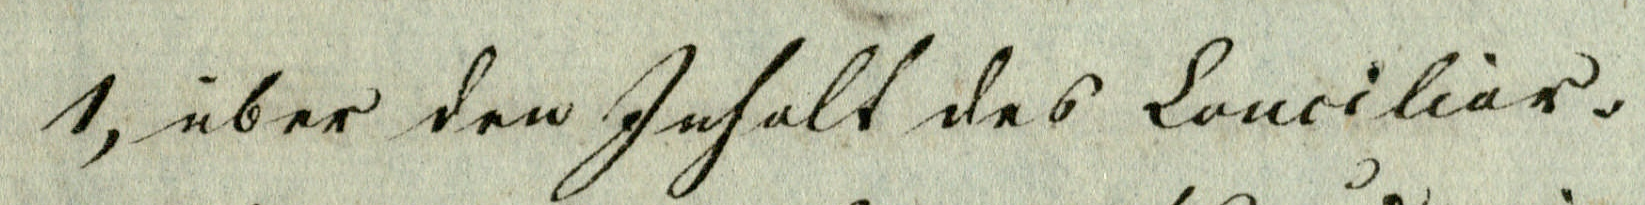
1, über den Inhalt des Conciliar¬
